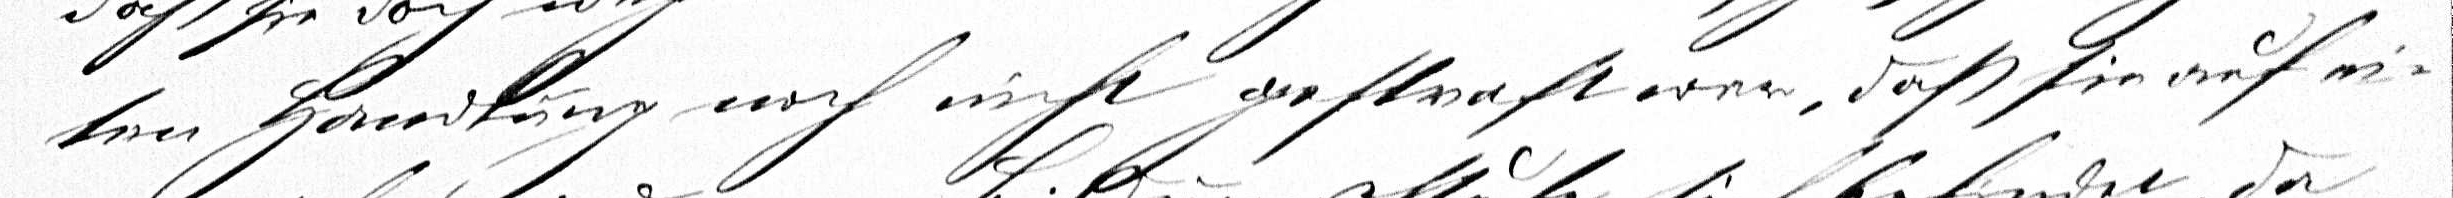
ten Handlung noch nicht gestraft war, daß sie auf ei¬
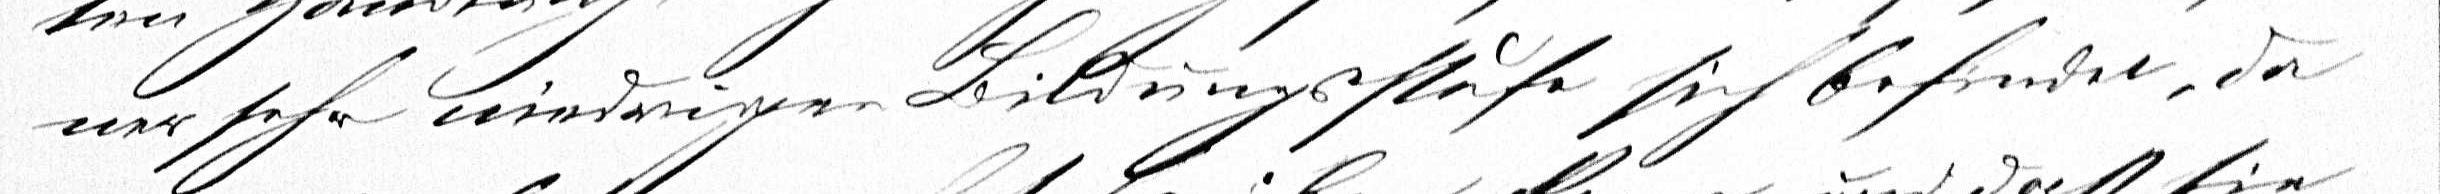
ner sehr niedrigen Bildungsstufe sich befindet, da
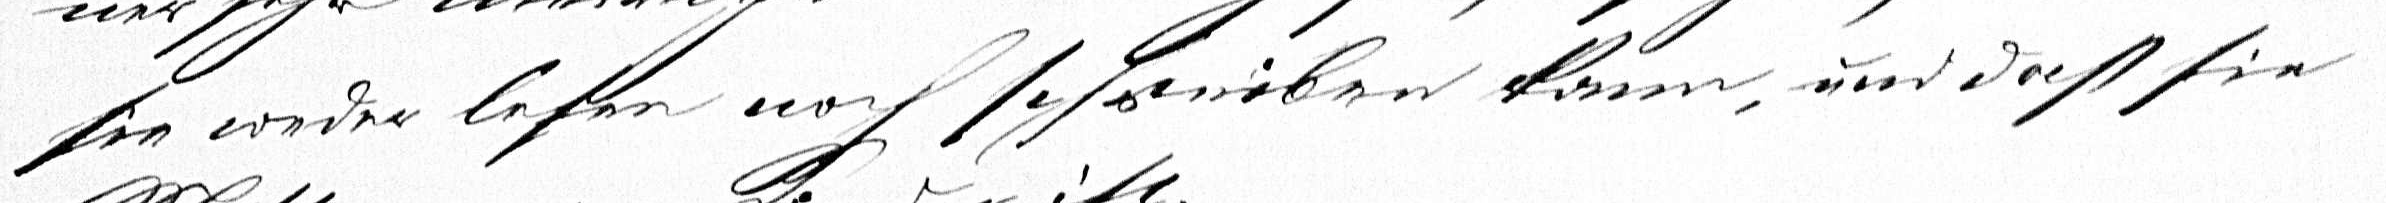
sie weder lesen noch schreiben kann, um daß sie
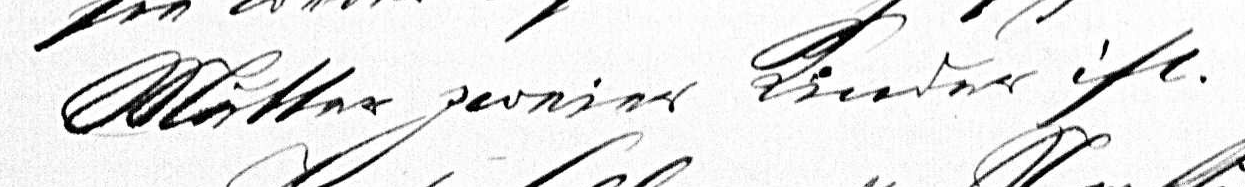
Mutter zweier Kinder ist.
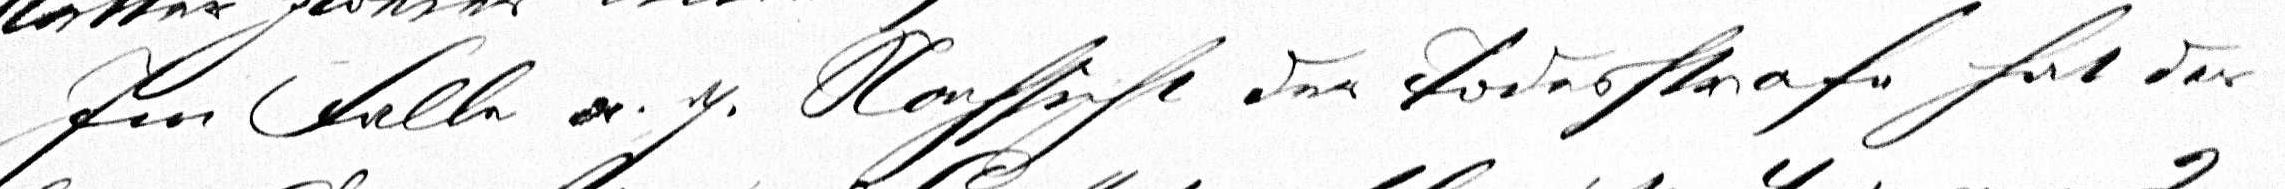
Jm Falle a. g. Nachsicht der Todesstrafe hat der
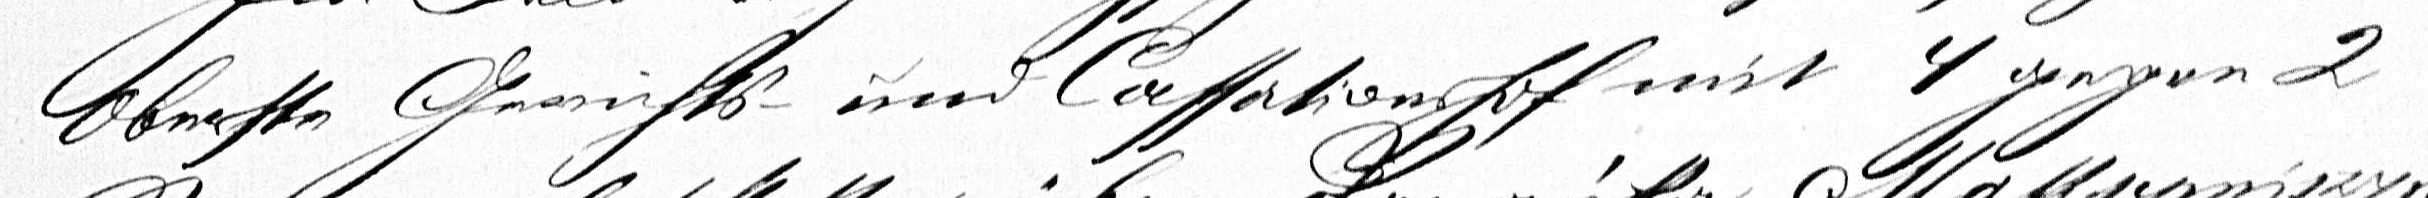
Oberste Gerichts- und Cassationshof mit 4 gegen 2
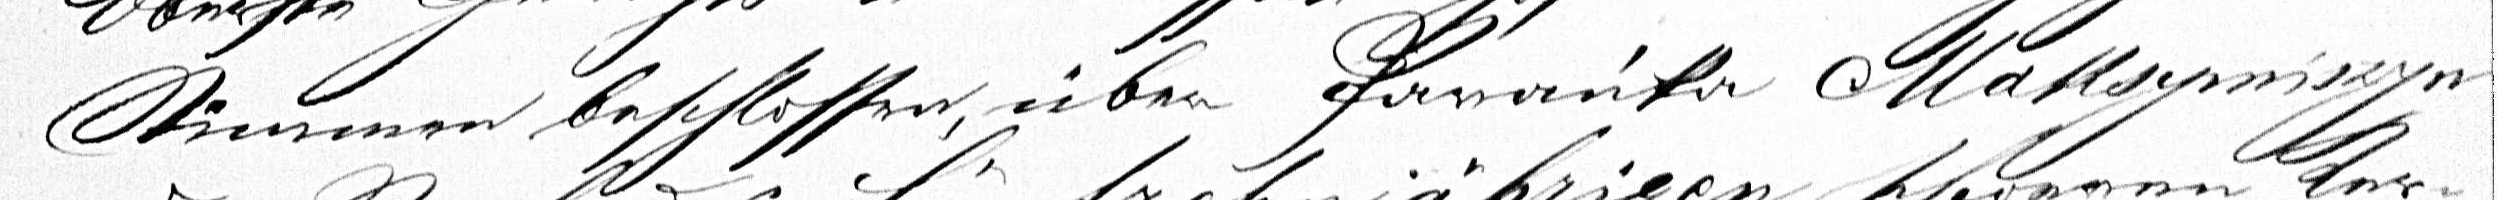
Stimmen beschlossen, über Parańka Maksymszyn
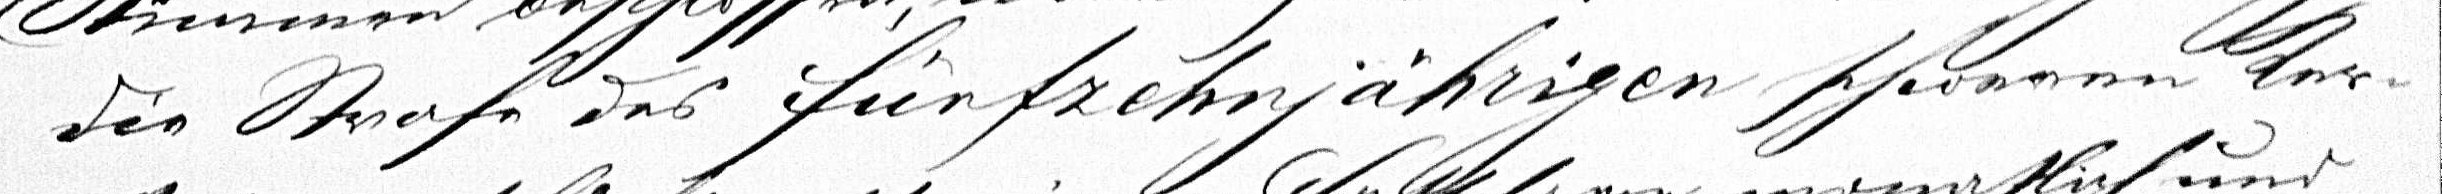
die Strafe des fünfzehnjährigen schweren Ker¬
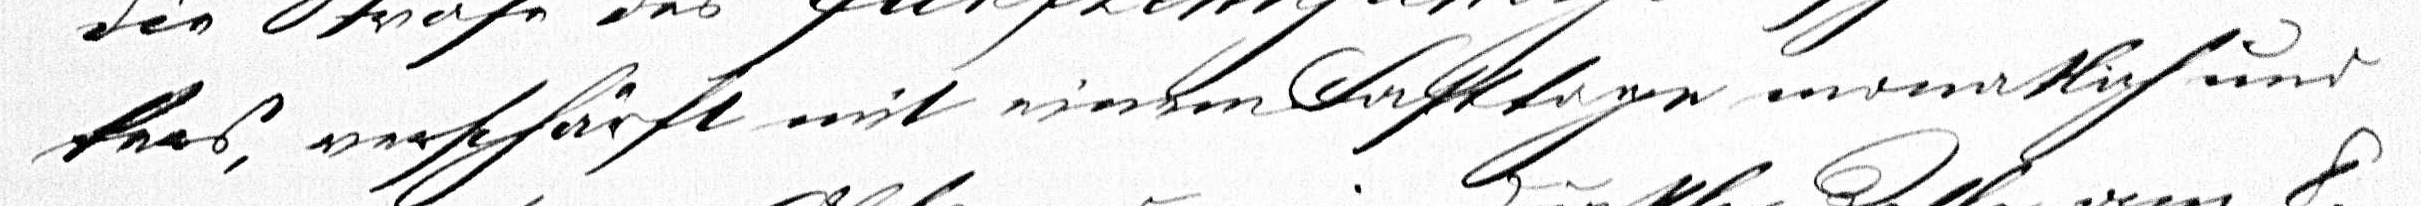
kers, verschärft mit einem Fasttage monatlich und
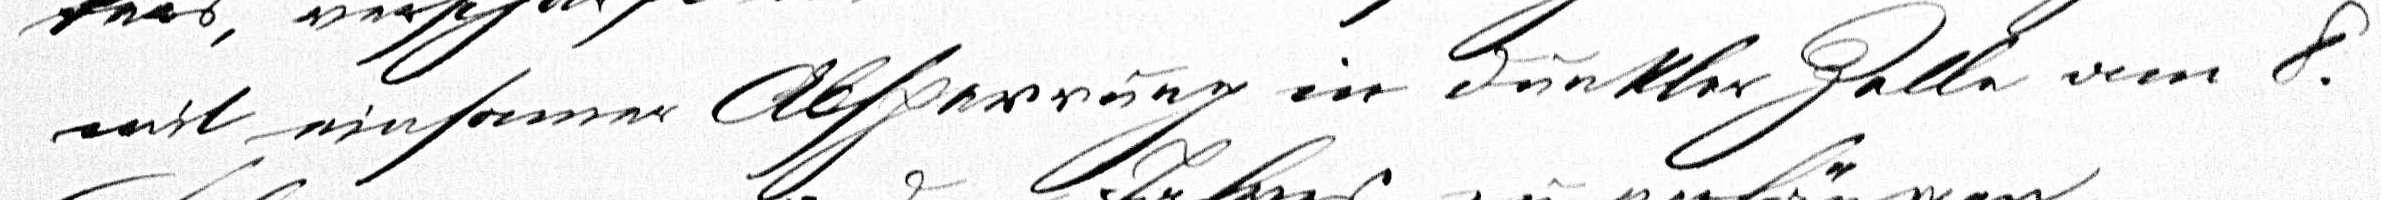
mit einsamer Absperrung in dunkler Zelle am 8.
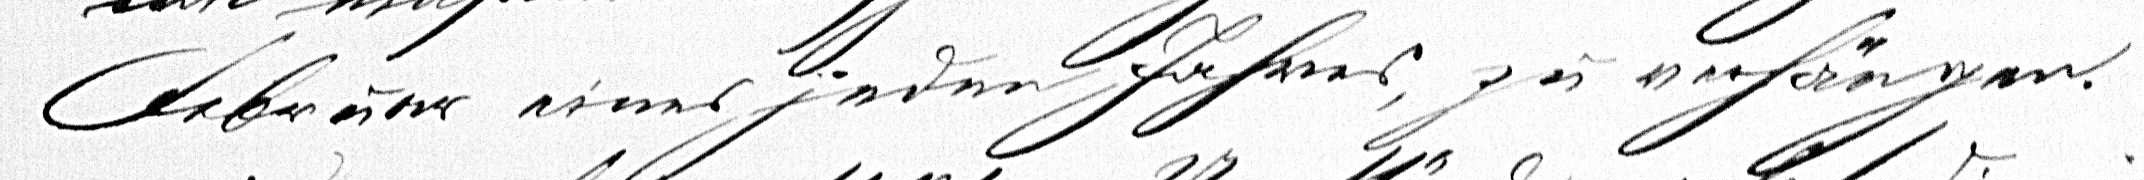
Februar eines jeder Jahres, zu verhängen.
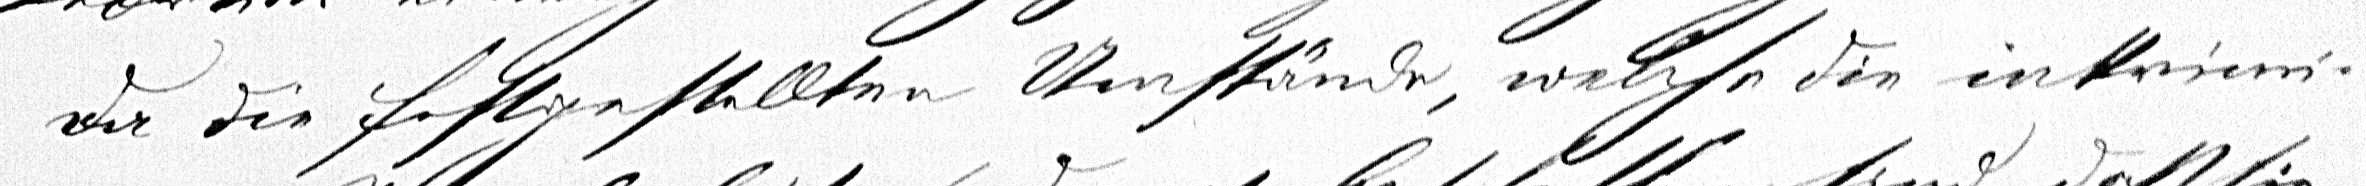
Da die festestellten Umstände, welche die inkrimi¬
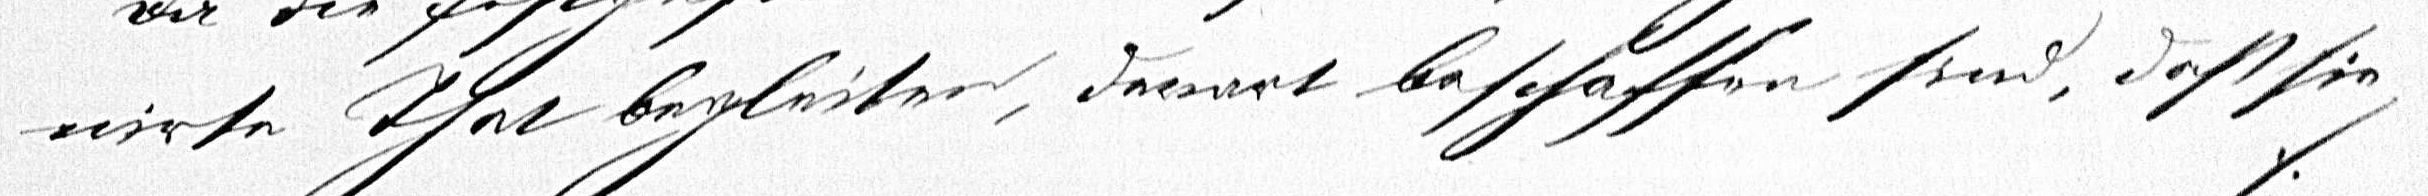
nirte That beyleiten, derart beschaffen sind, daß sie
